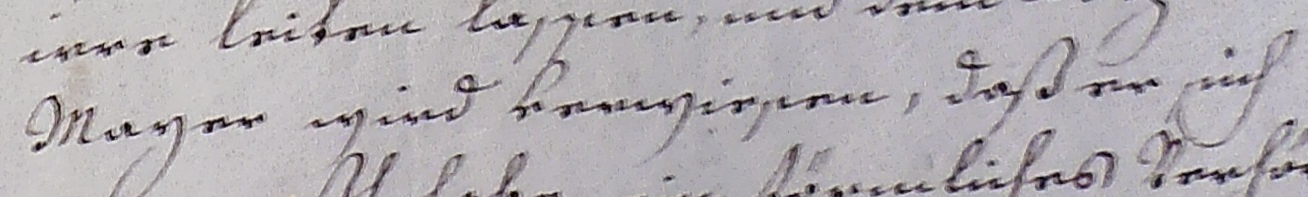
Mayer wird verwiesen, daß er sich
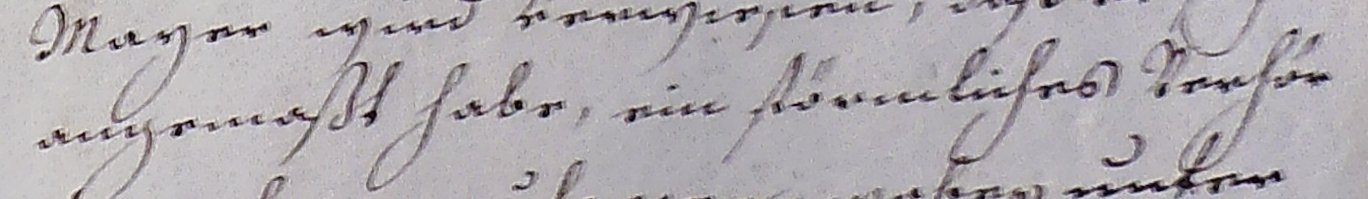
angemaßt habe, ein förmliches Verhör
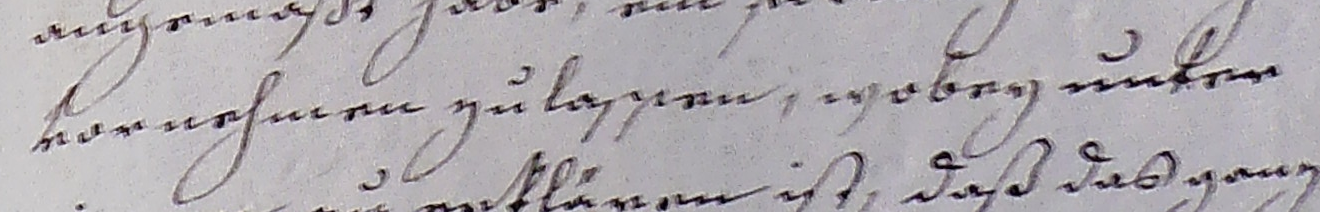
vornehmen zulassen, wobey unter
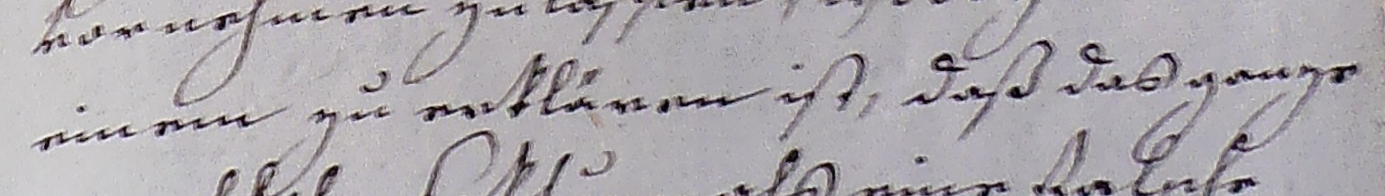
einem zu erklären ist, daß das ganze
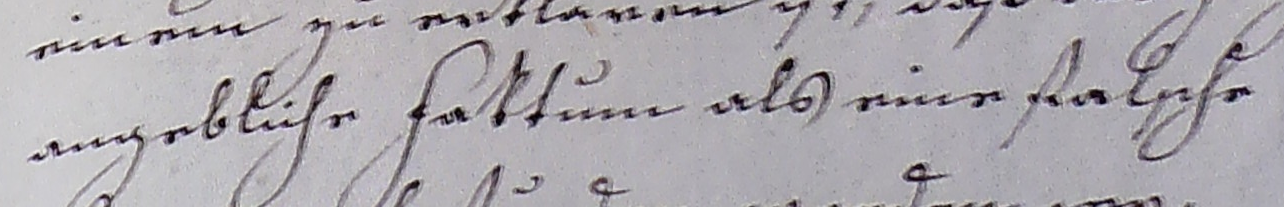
angebliche Faktum als eine falsche
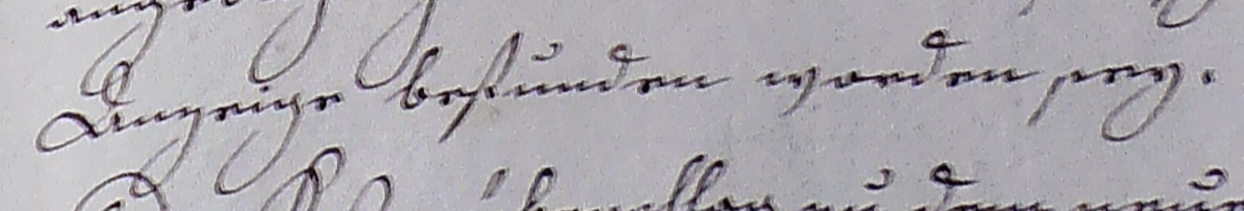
Anzeige befunden worden sey.
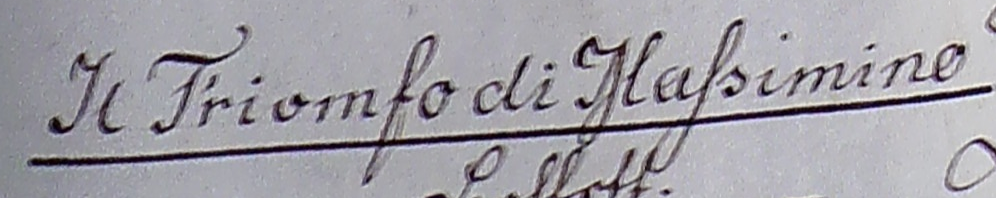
Il Triomfo di Massimino
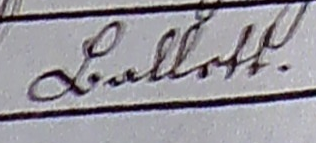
Ballett.
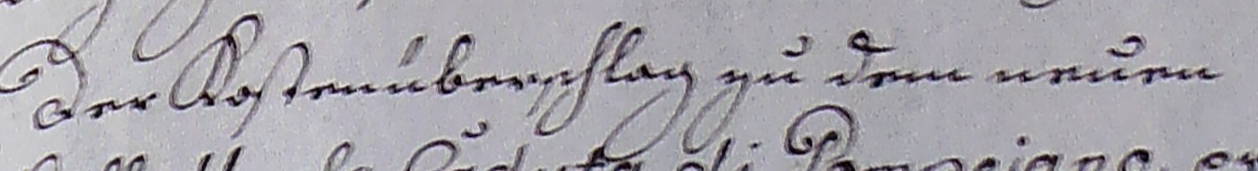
Der Kostenüberschlag zu dem neuen
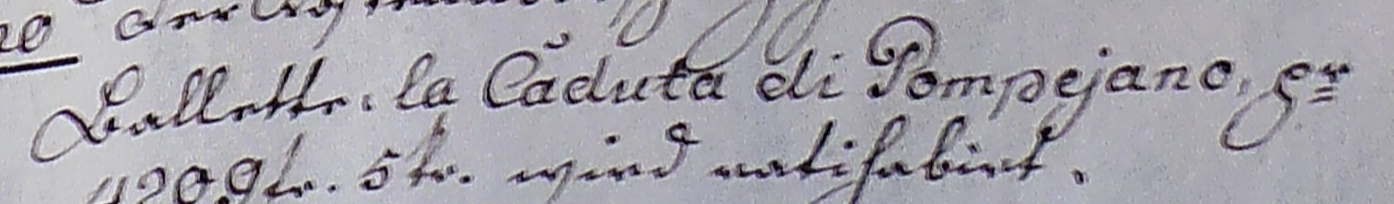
Ballette: la Caduta di Pompejano pr͇
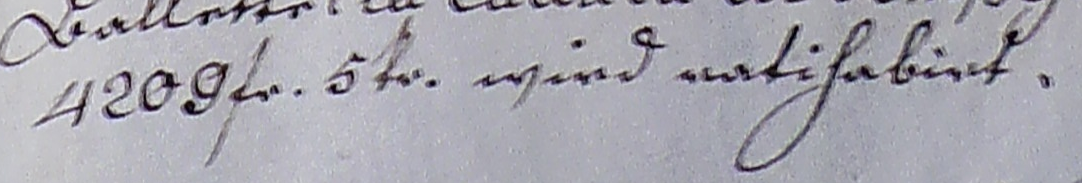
4209fr. 5kr. wird ratihabirt.
